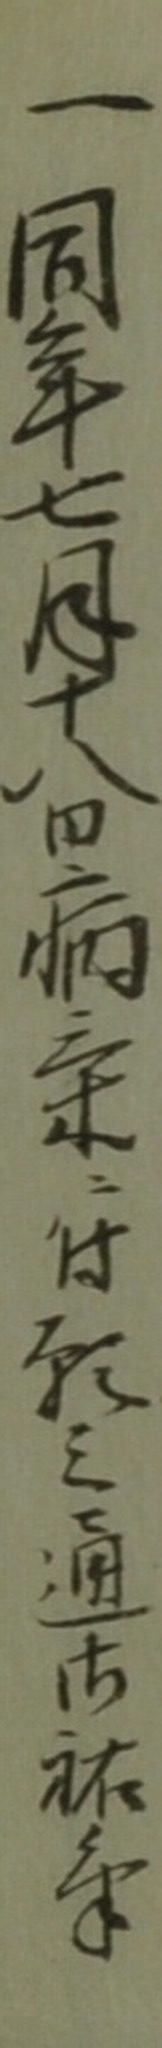一同年七月十八日病気ニ付願之取御祐筆
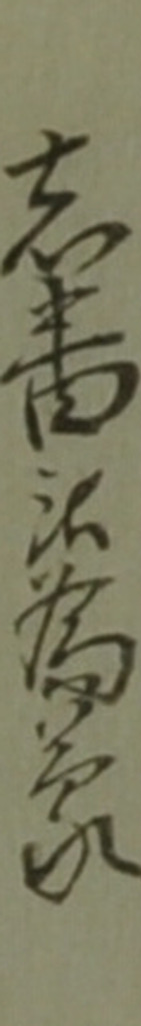者番被為蒙
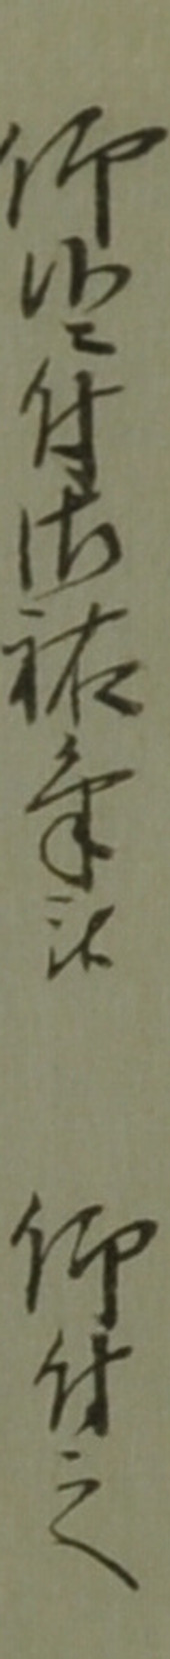仰候ニ付御祐筆被仰付之
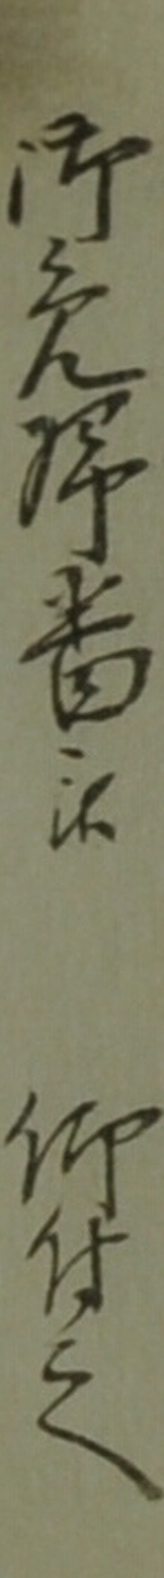御免帰番被仰付之
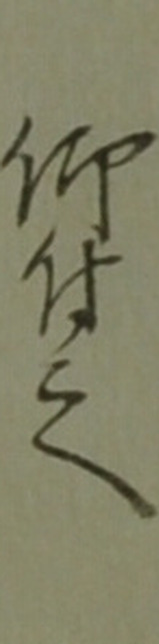仰付之
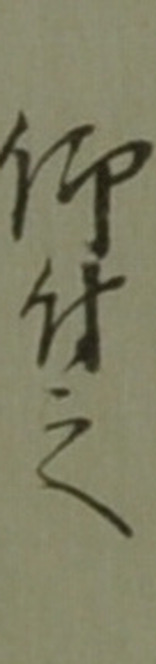仰付之

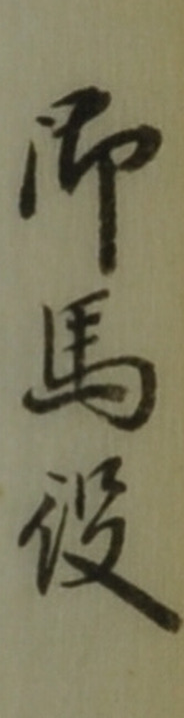御馬役
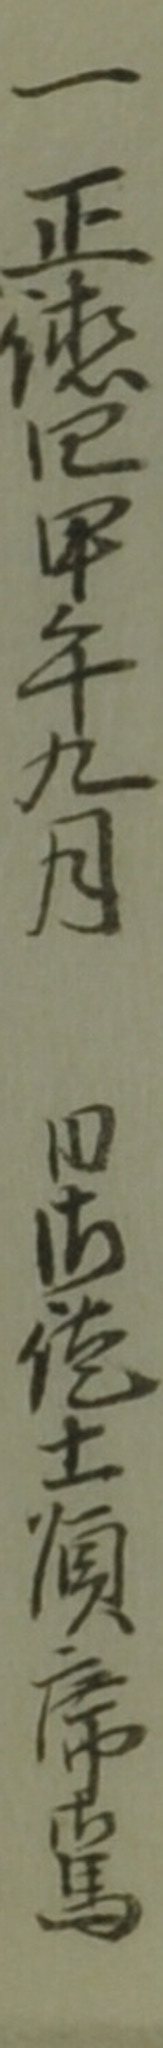一正徳四甲午九月日御徒士順席御馬
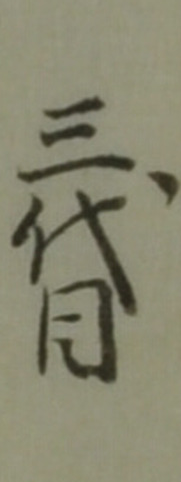三代目
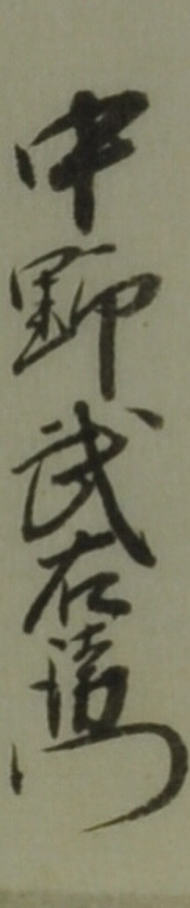中野武右衛門
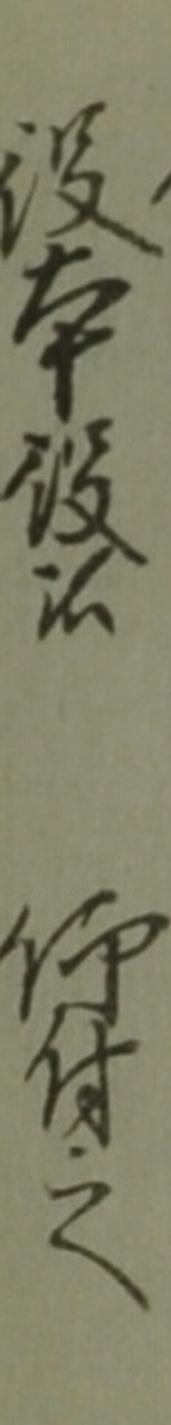役本役被仰付之
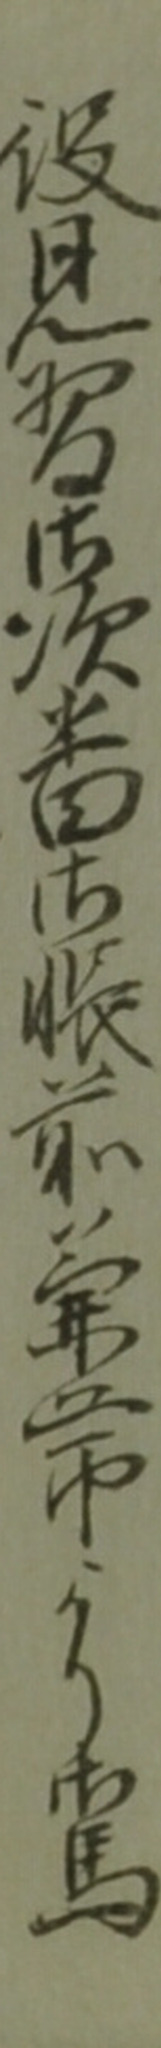役見習御次番御帳前兼帯より御馬
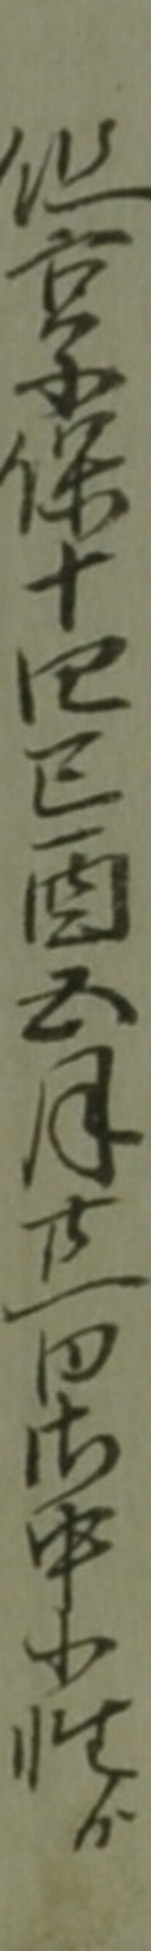但享保徒士己酉五月廿一日御中小姓より
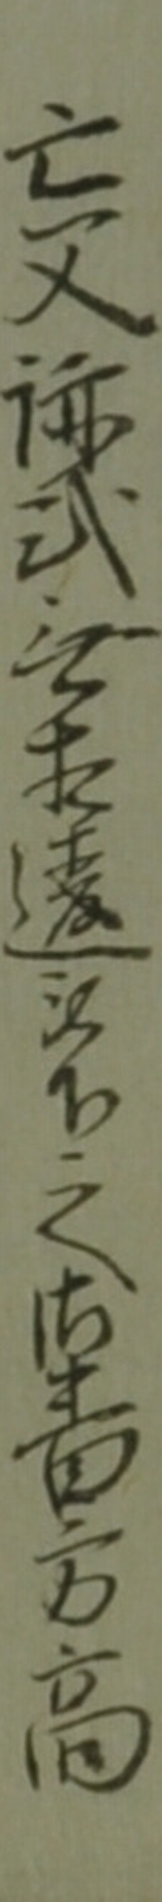亡父跡式無相違被下之御番方高
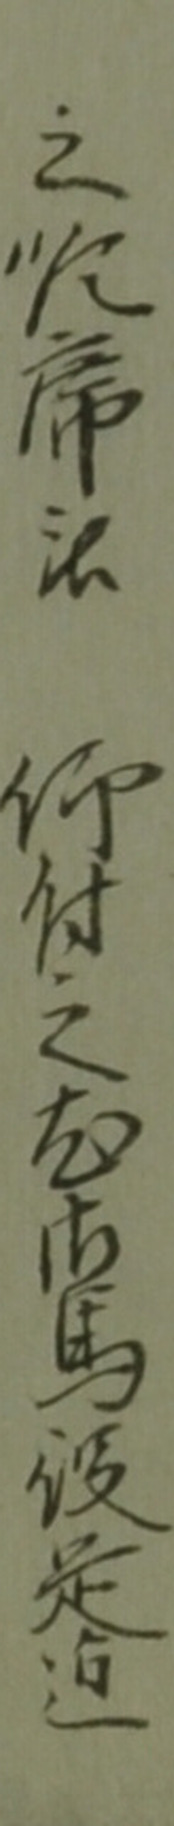之順席被仰付之尤御馬役是迄
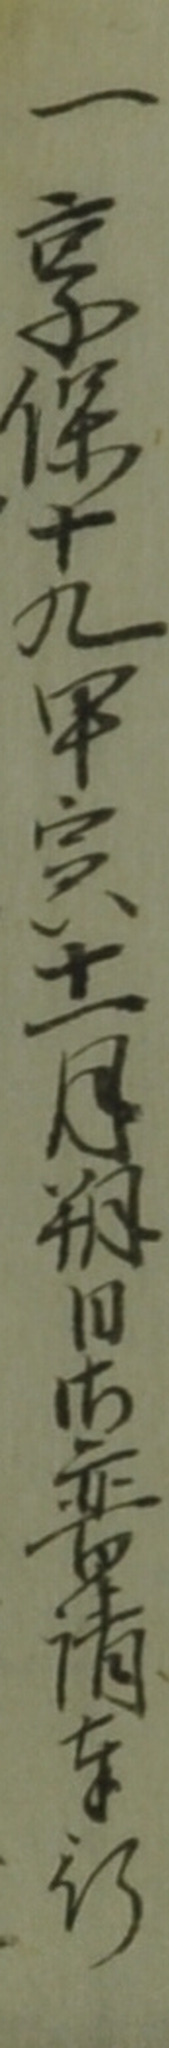一享保十九甲寅十一月朔日御普請奉行
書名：諸御役代々録（八）
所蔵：伊那市立高遠町図書館・合同会社AMANE
